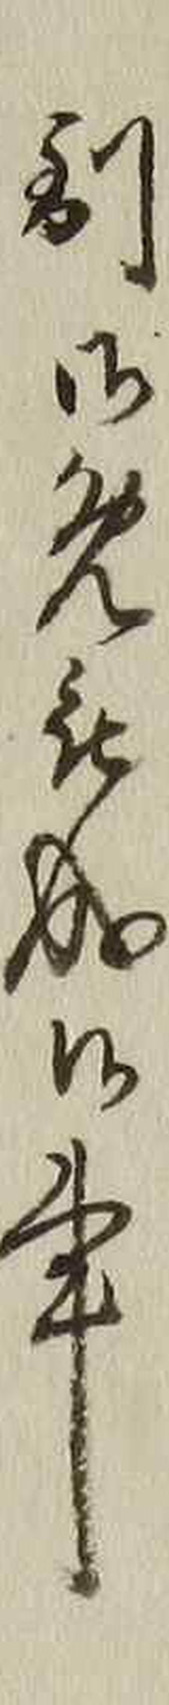到御免被成候事
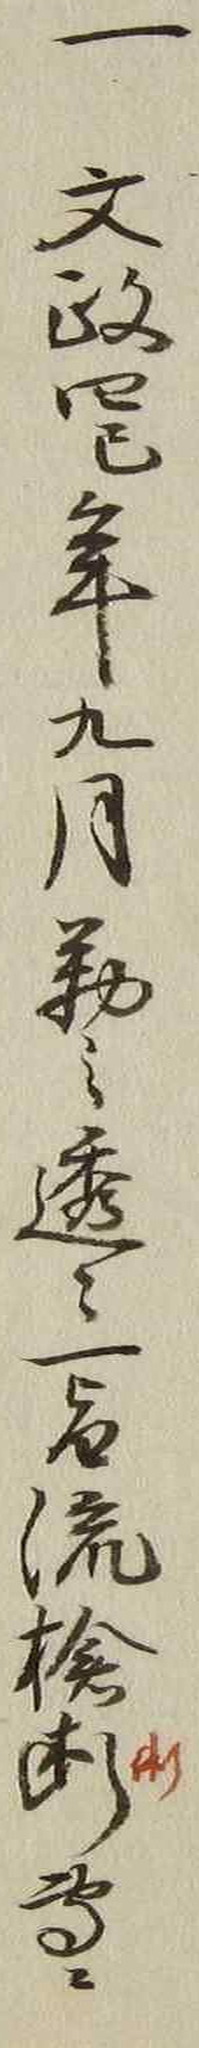一文政四巳年九月勤之透々一旨流槍術専ニ
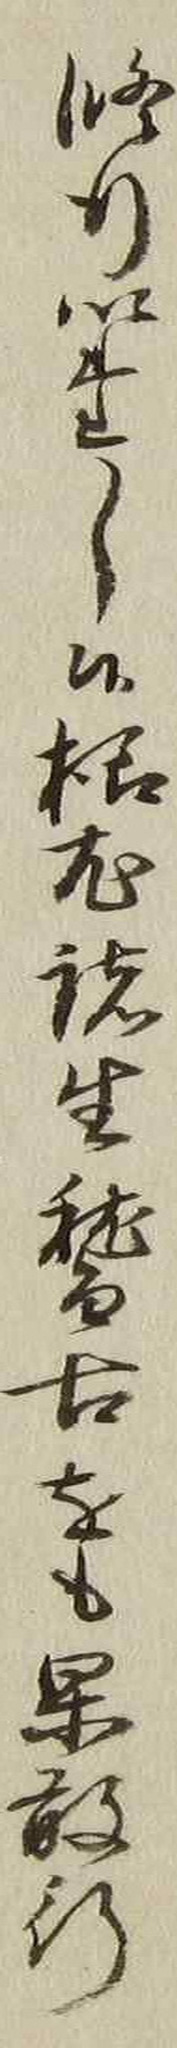修行いたし候様尤諸生稽古をも果敢行
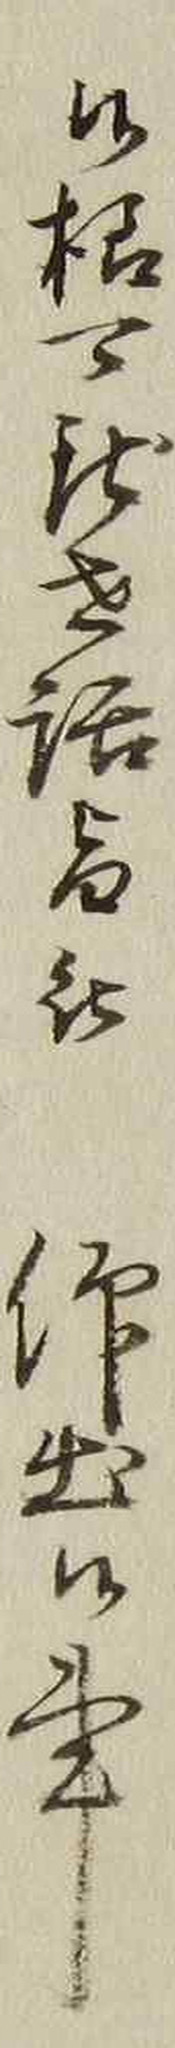候様可致せ話旨被仰出候事
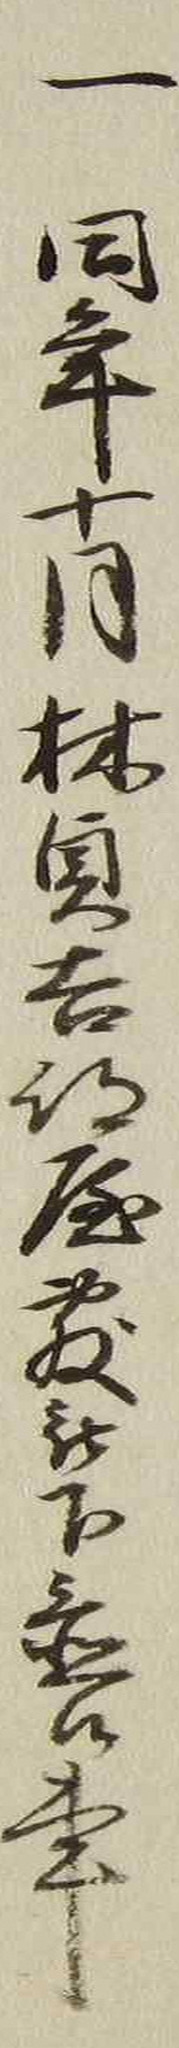一同年十月林貞吉跡屋敷被下置候事
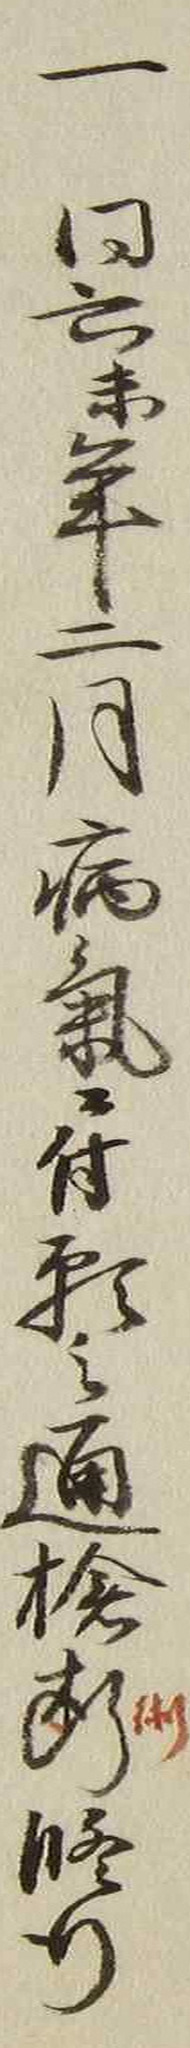一同六未年二月病気ニ付願之通槍術修行
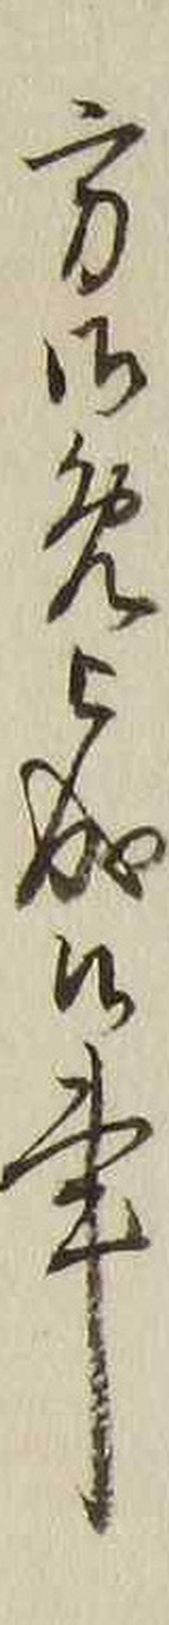方御免被成候事

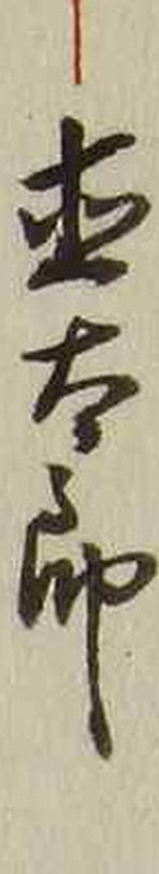直太郎
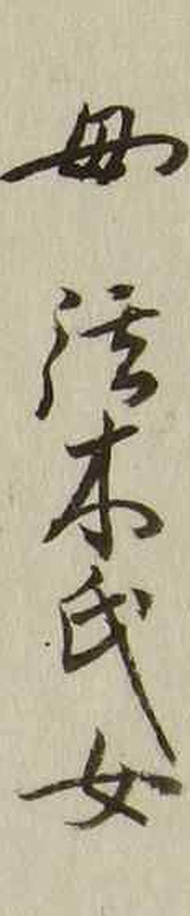母弦木氏女
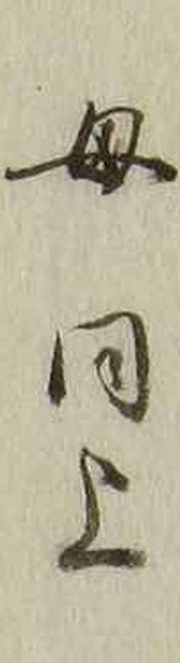母同上
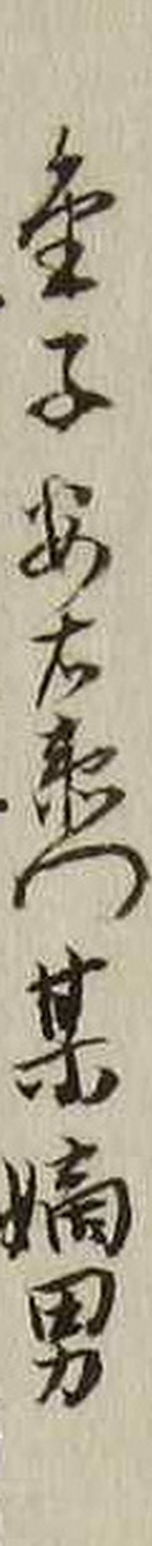金子安右衛門某嫡男
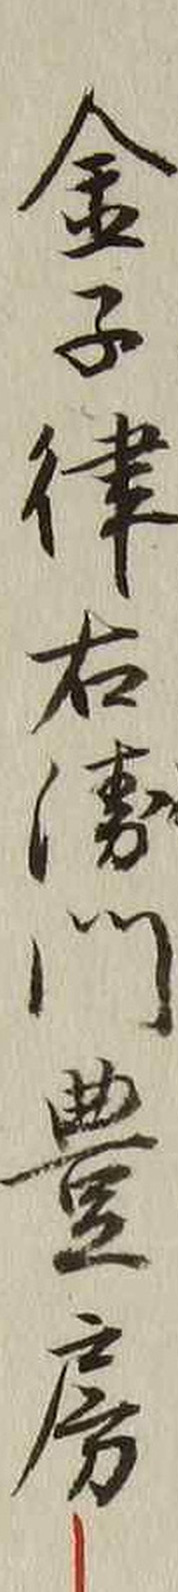金子律右衛門豊房
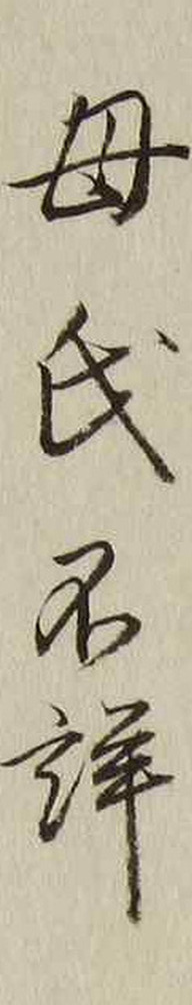母氏不詳
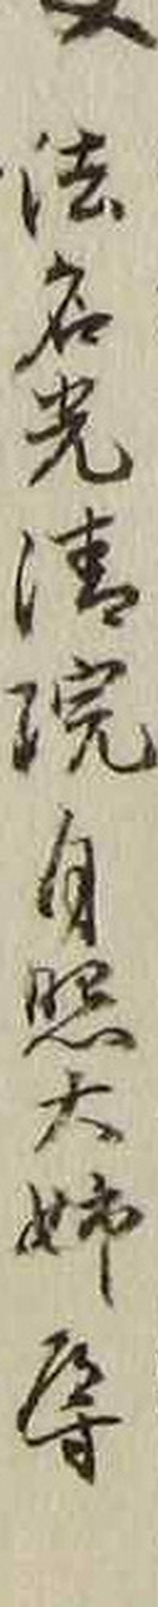法名光清院自照大姉導
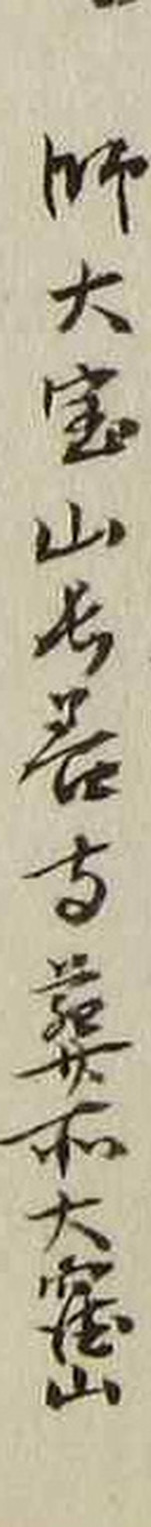師大宝山長善寺葬所大窪山
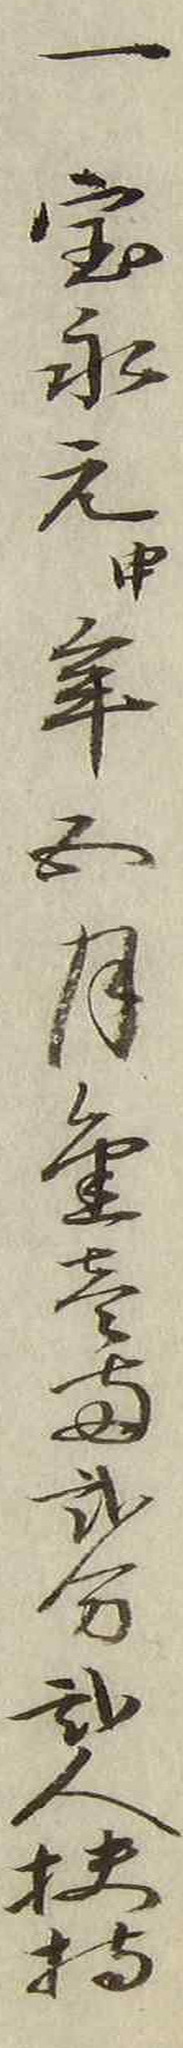一宝永元申年五月勤壱両弐分弐人扶持
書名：諸士系譜　巻之114　か之部22
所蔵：会津若松市立会津図書館
